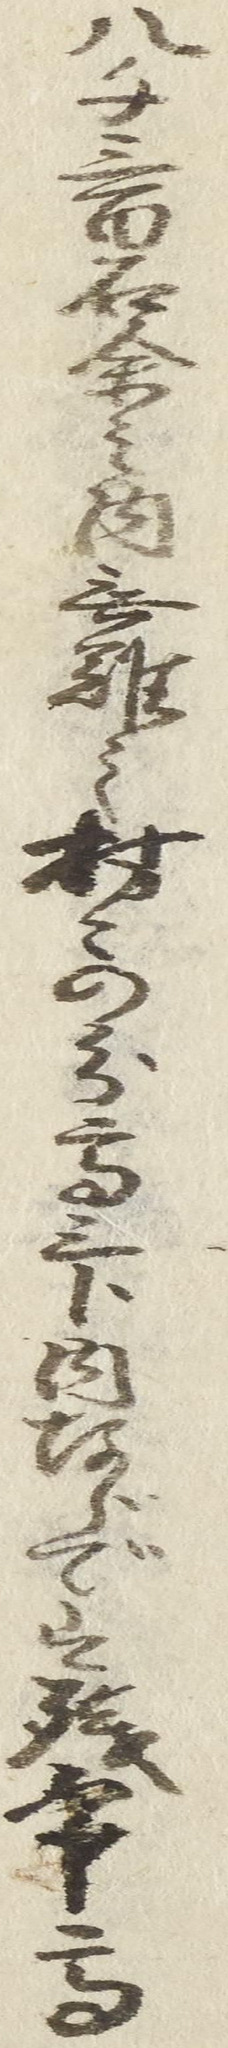八千三百石余之内無難之村々の分高三分内ならでは残不申高
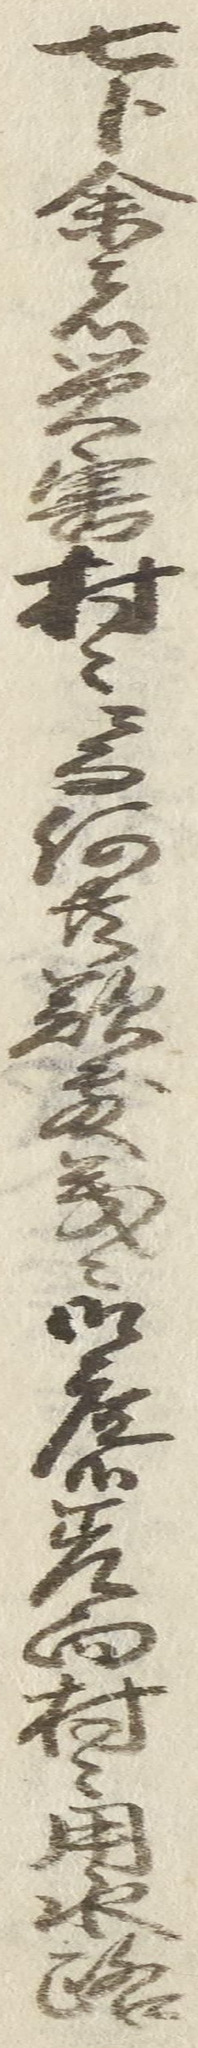七分余は災害村々ニ而何共歎敷義ニ御座候差向村々用水路
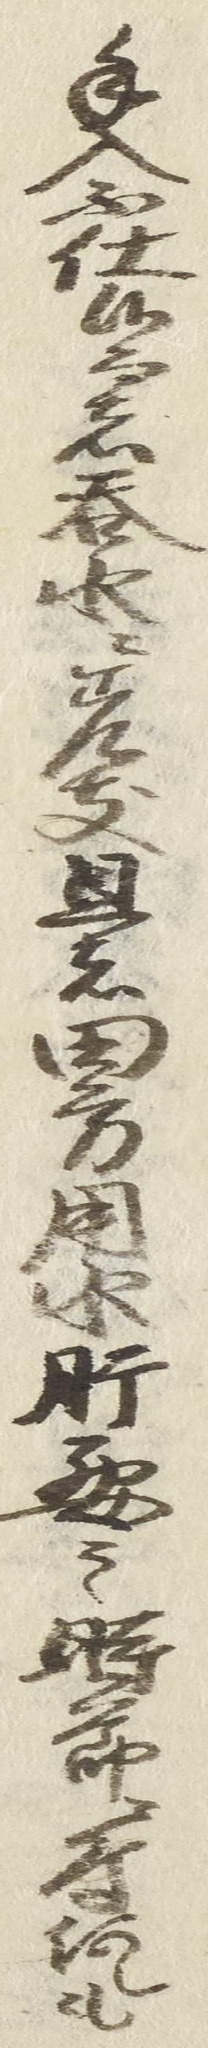手入不仕候而は呑水ニ差支且は田方用水肝要之時節ニ付何レも
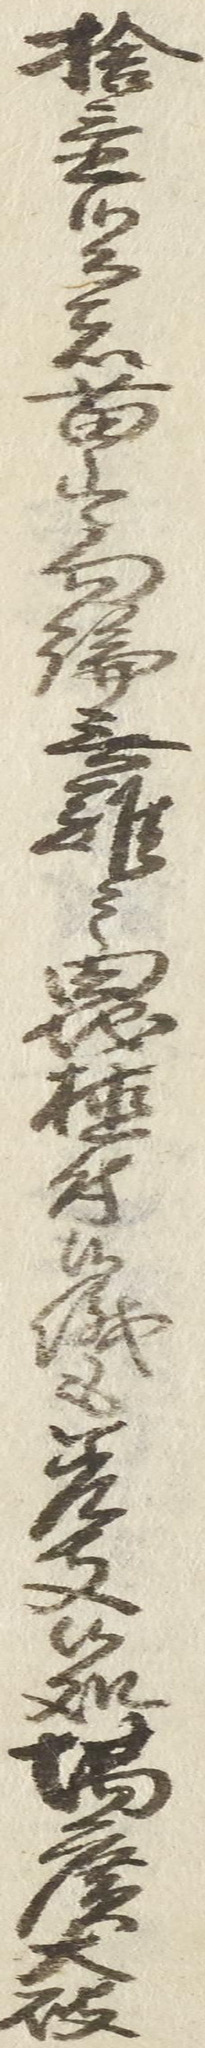捨置候而は苗は勿論無難之田地植付候儀も差支候処場広大破
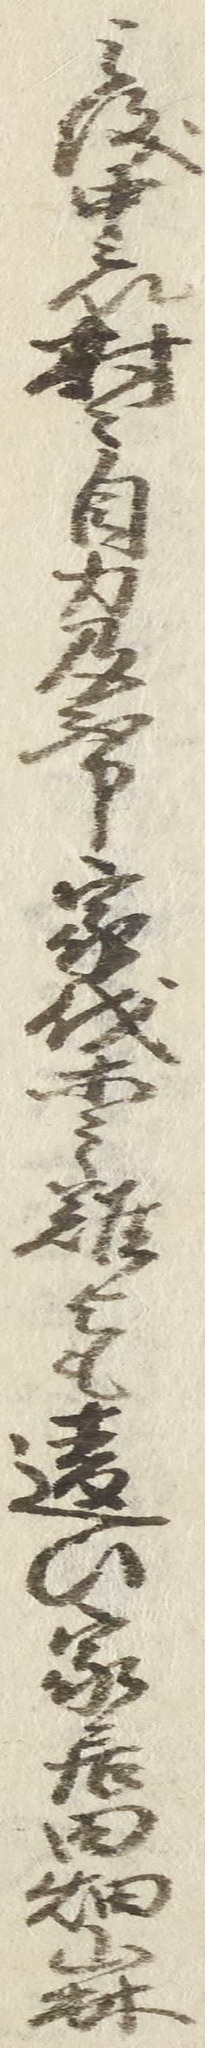之儀中々以村々自力及不申家伐等之難与も違ひ家居田地山林
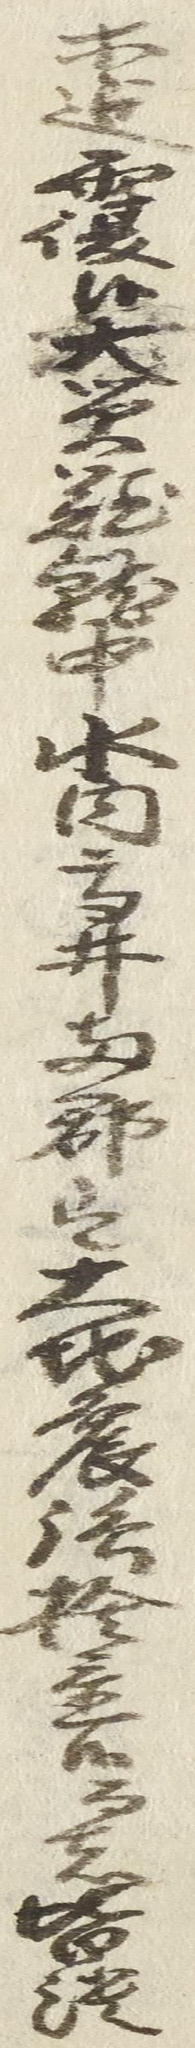等迄覆候大災難就中水内高井両郡は大地震強捨置候而は皆潰
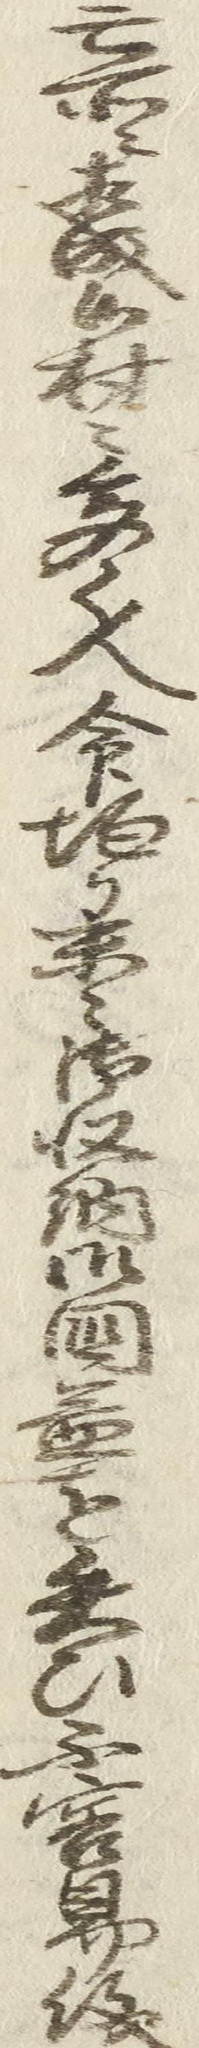亡所ニ相成候村々多く人命泊末々御収納御国益を失ひ不容易儀
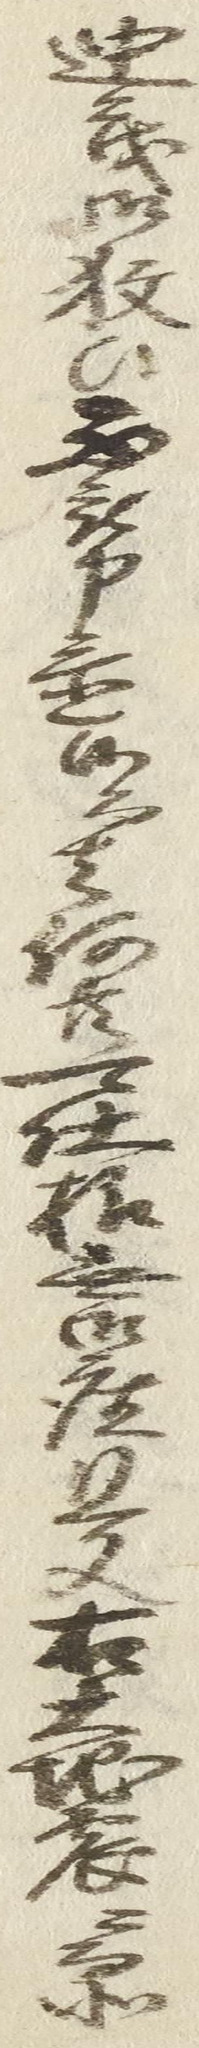迚も御救ひ不被申置候而は何共可仕様無御座且又右大地震ニ而北
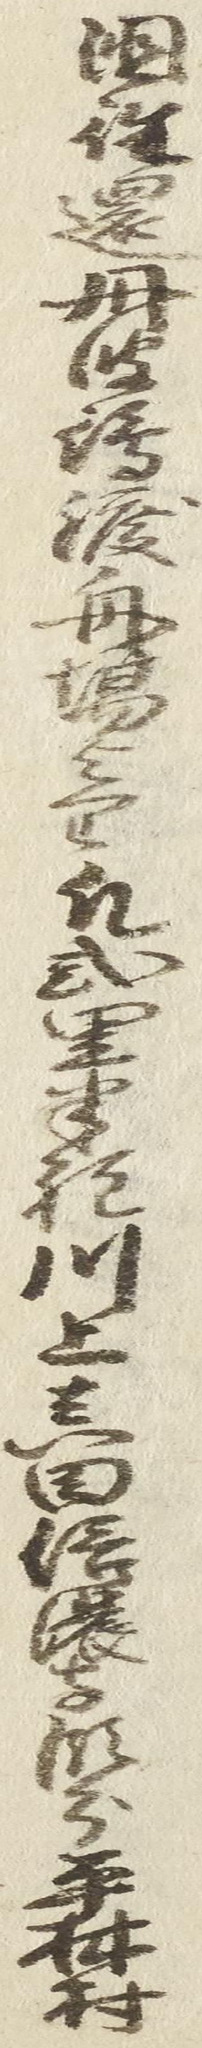国往還丹波嶋渡舟場より凡弐里半程川上真田信濃守領分平林村
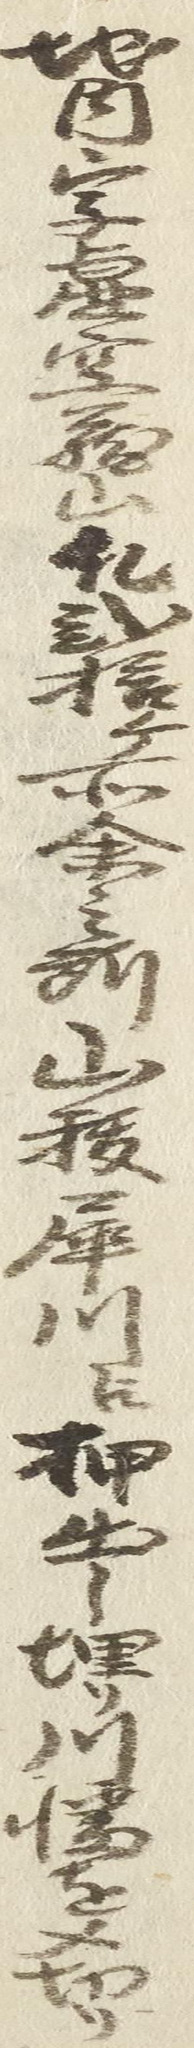地内字虚空蔵山凡弐拾ヶ所余之処山稜犀川江押出し埋り川端を〆切り
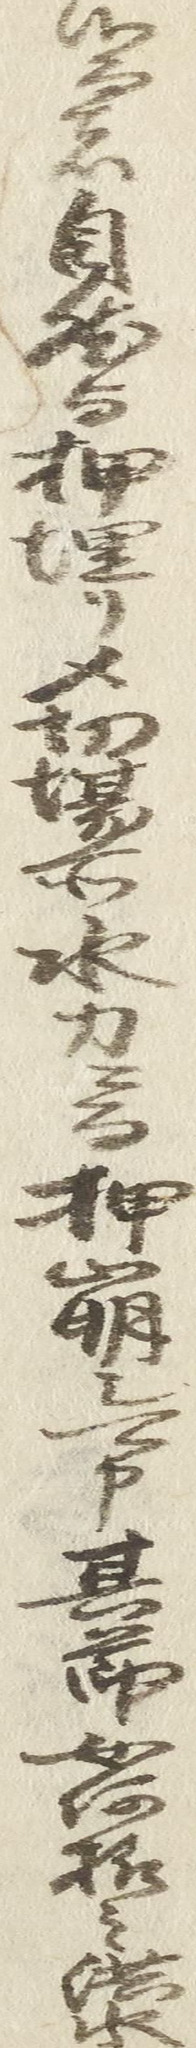候而は自然と押埋り〆切場所水力ニ而押崩シ可申其節如何様之洪水
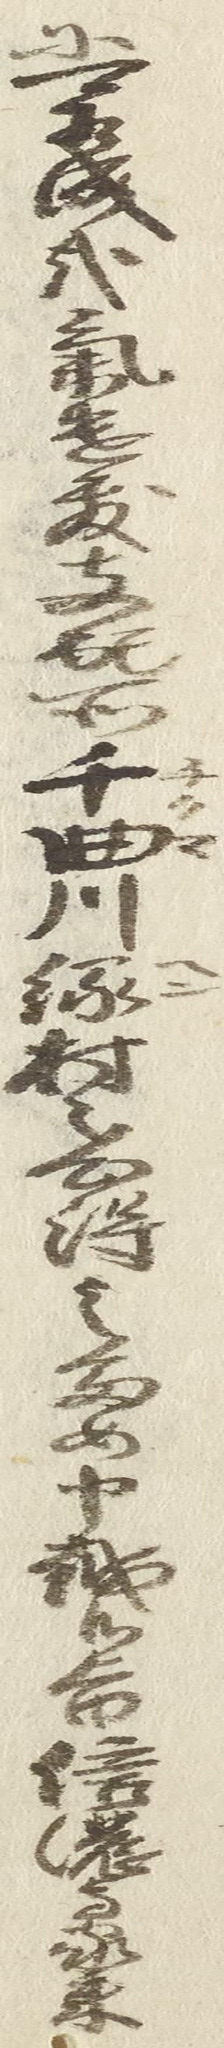に可相成哉気遣敷支配所千曲川縁村々心得之ため申越候旨信濃守家来
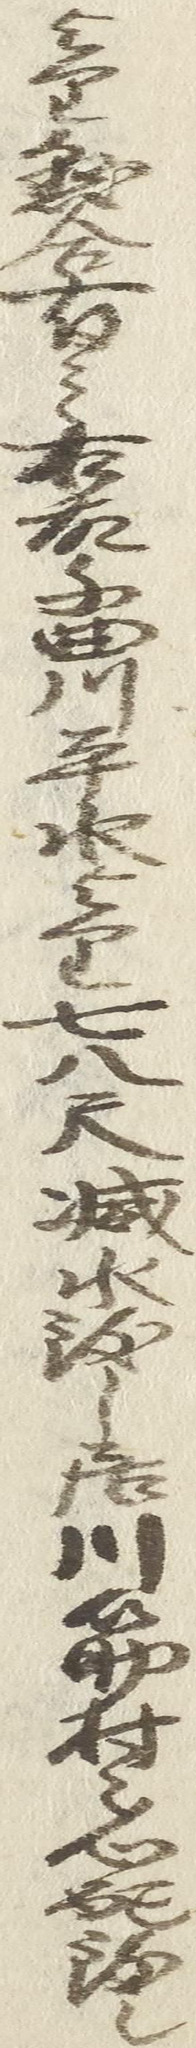より懸合有之右故千曲川平水より七八尺減水致し居川筋村々心配致し
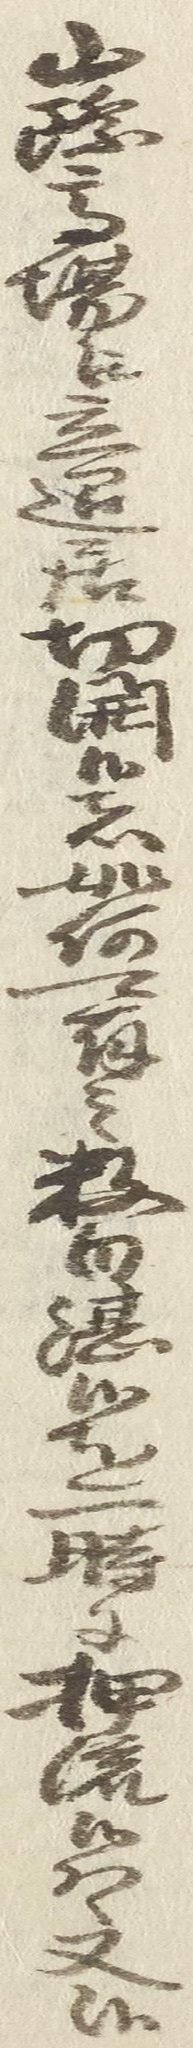山際高場江立退居切開候は如何可有之数日湛候を一時に押流候はゝ又候
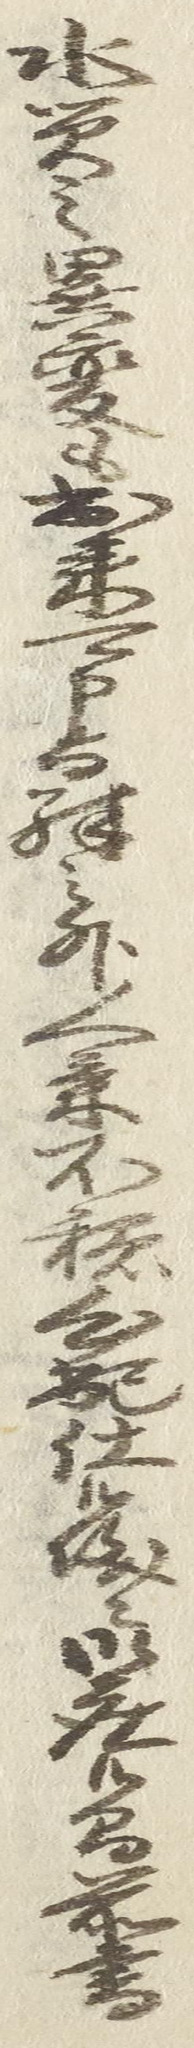水災之異変も出来可申旨殊之外人気不穏心配仕候儀ニ御座候間前書
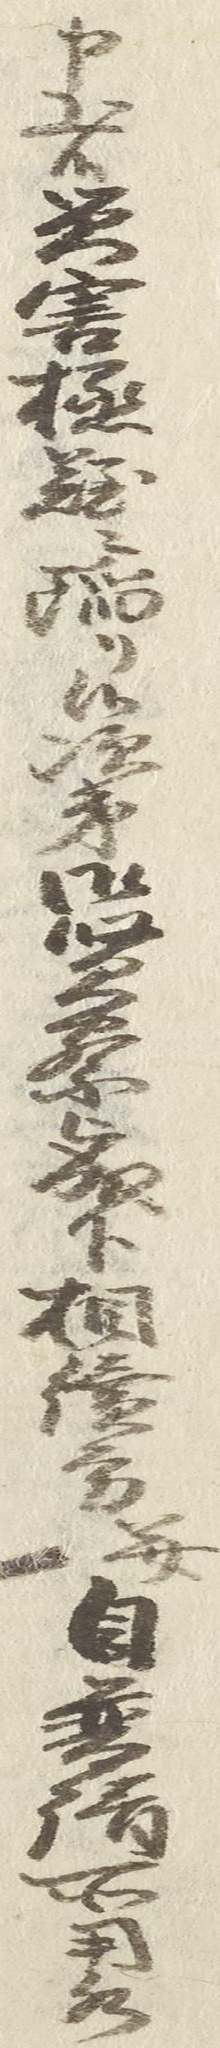申上候災害極難ニ陥り候次第御賢察被成下相続方并自普請所用水
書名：従往古地震御届書記誌之一
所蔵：東京大学地震研究所図書室 Earthquake Research Institute Library, The University of Tokyo, JAPAN
